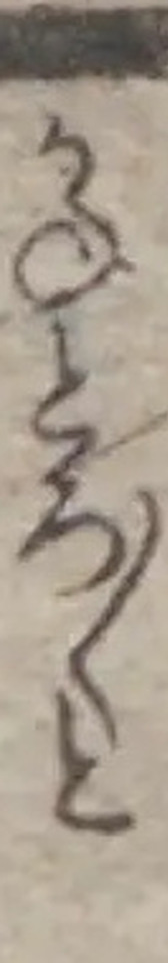かねとろ〳〵と
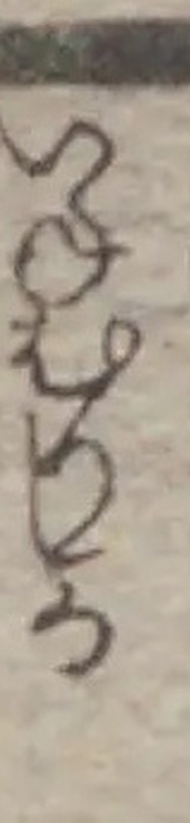いねむりしか
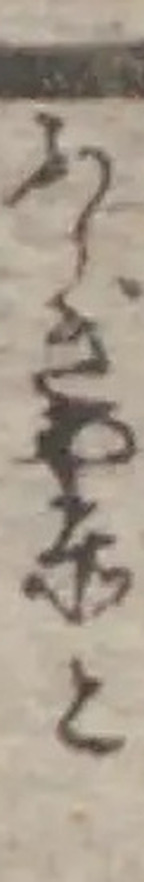ふしぎや赤と
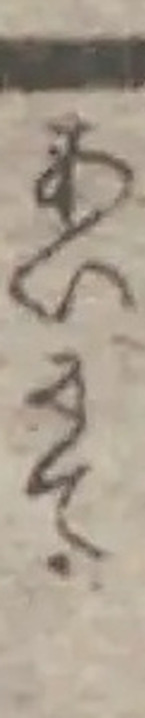あいにて
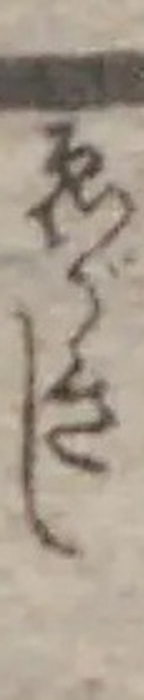ゑがきし
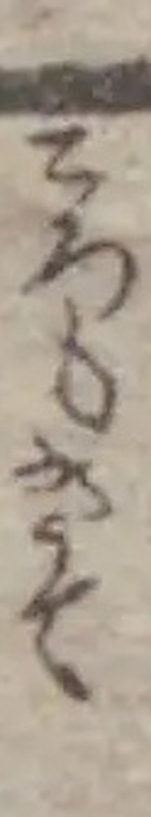ころもきて
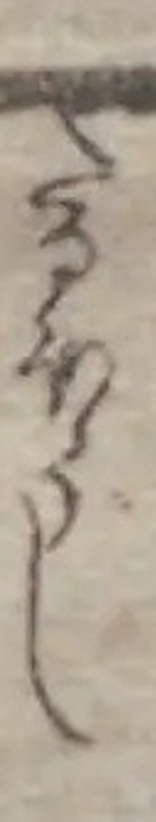たるほうし
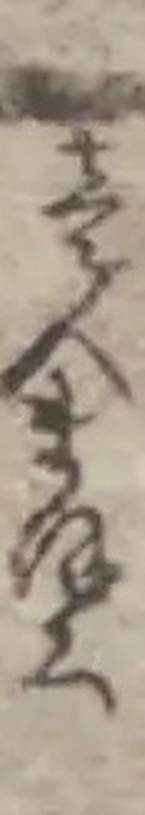壱人まほろ
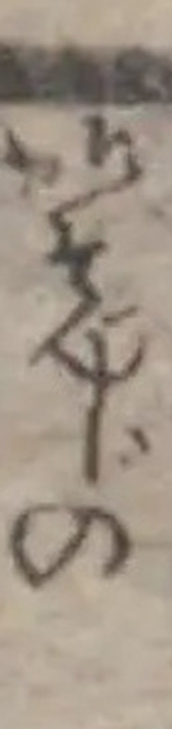御そんじの
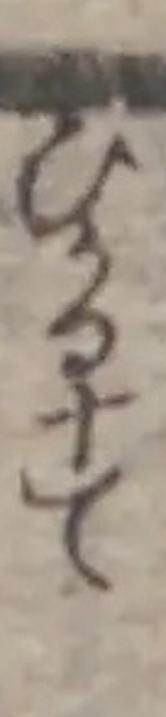ひかる十て
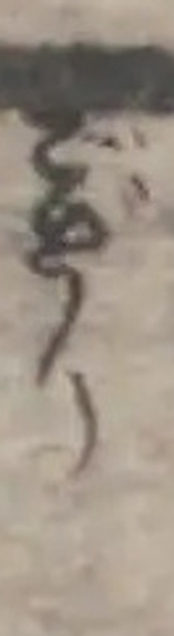こざり
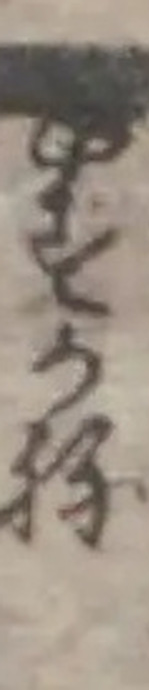ますかね
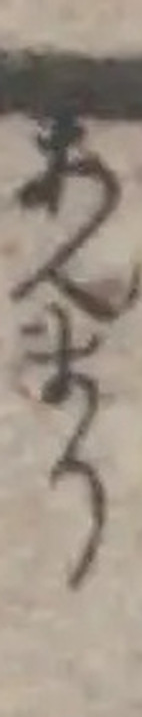あんまり
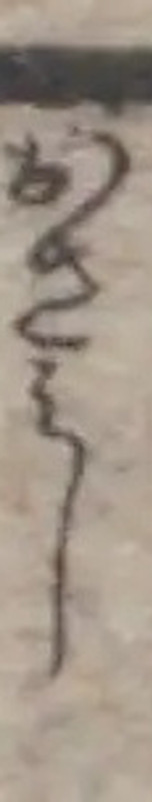おさみし
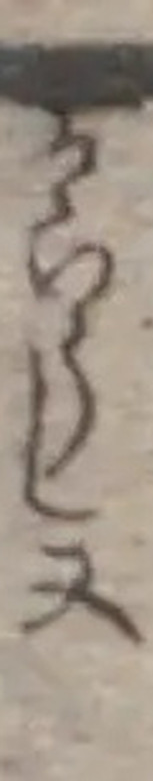からうし又
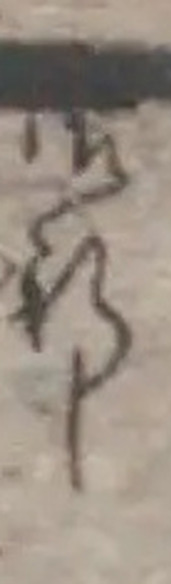御礼し
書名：早出来 3巻
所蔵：国立国会図書館 National Diet Library, JAPAN
